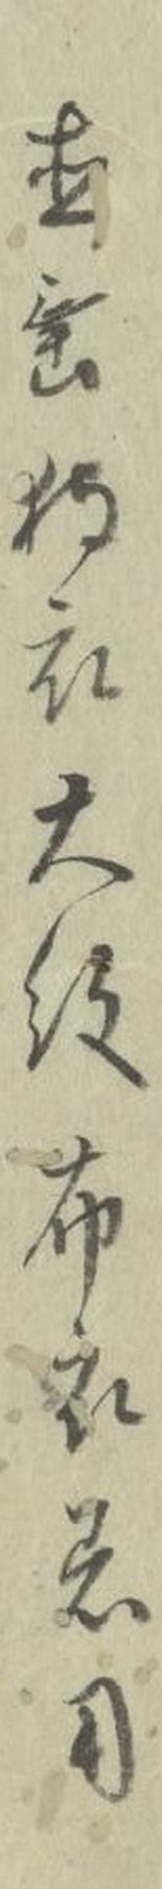直垂狩衣大紋布衣着用
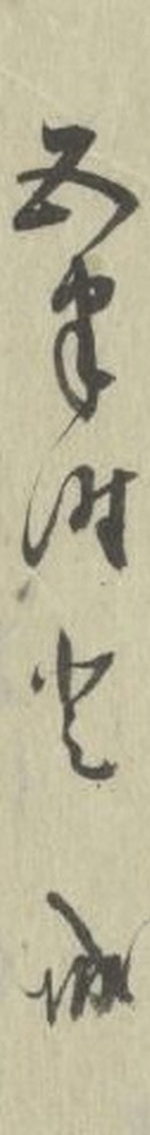五半時登城
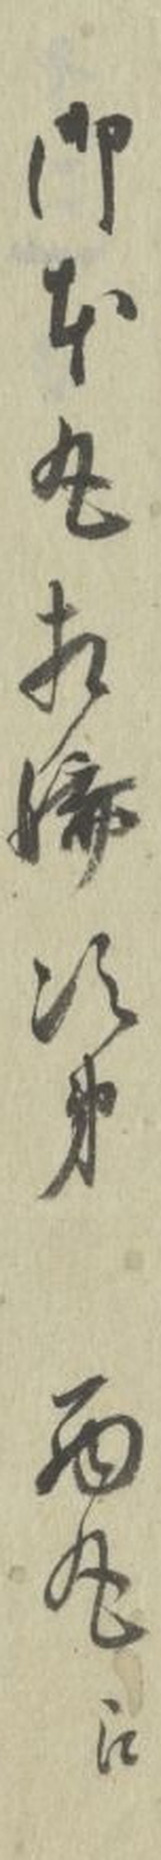御本丸相済次第西丸え
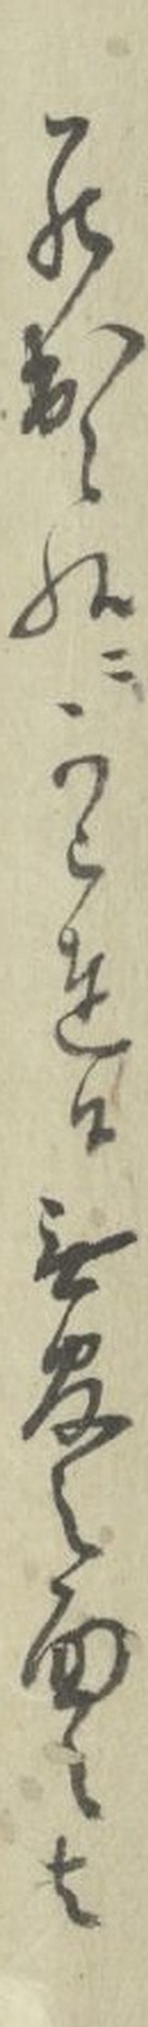罷出候様に可被達候無官之面々は
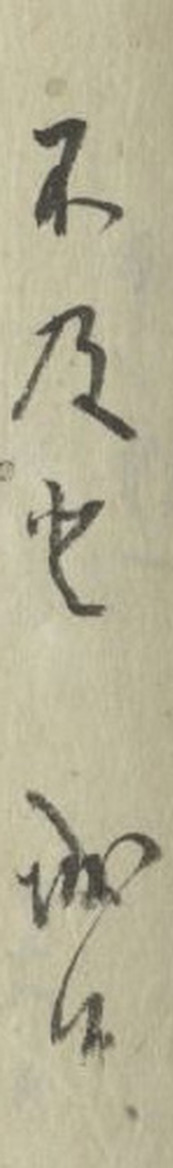不及登城候
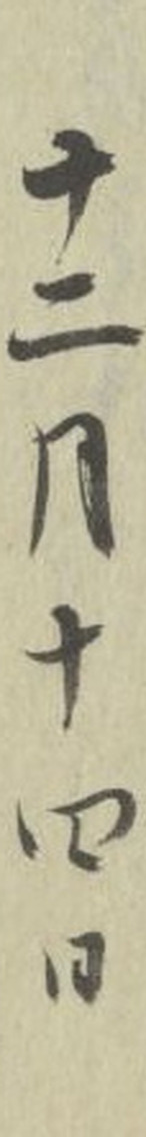十二月十四日
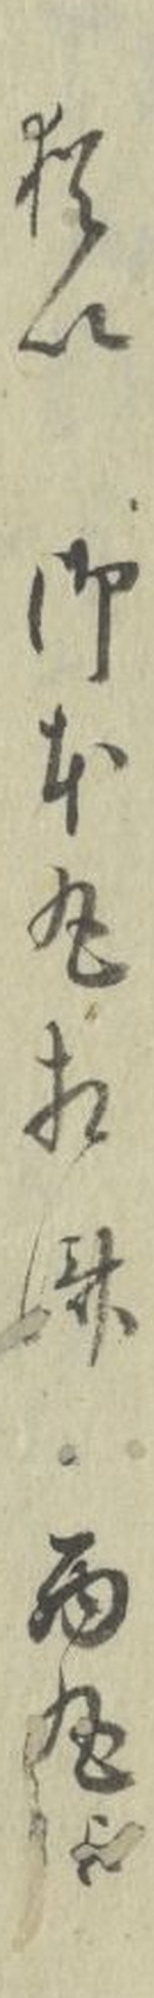猶以御本丸相済西丸え
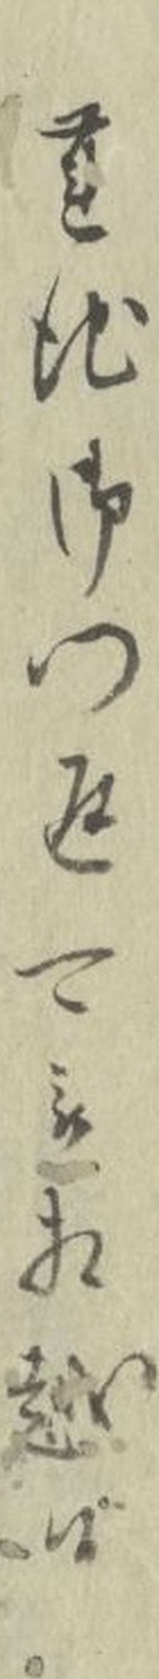蓮池御門通可被相越候
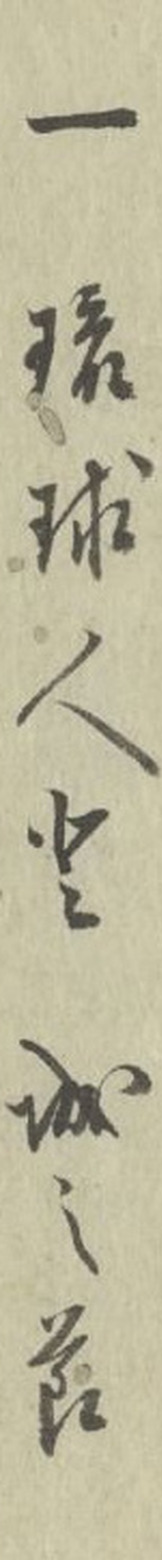一琉球人登城之節
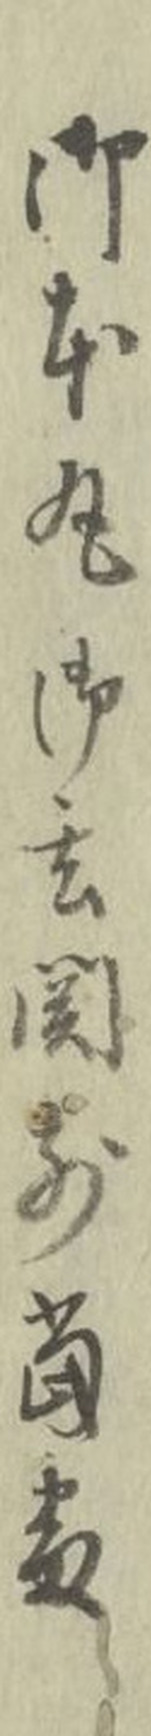御本丸御玄関前当番

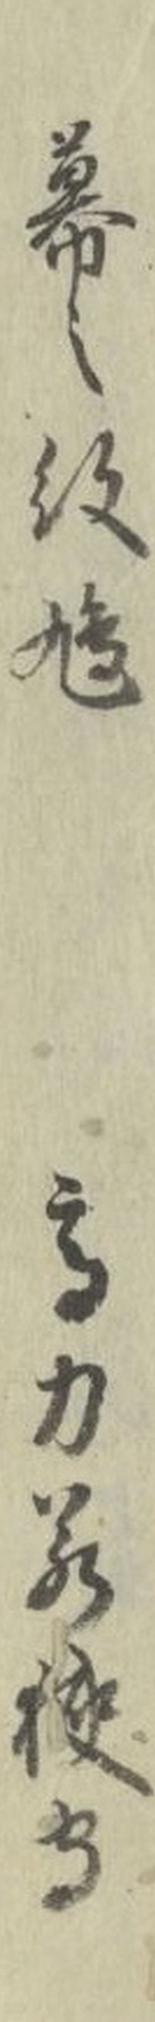幕之役鳩高力若狭守
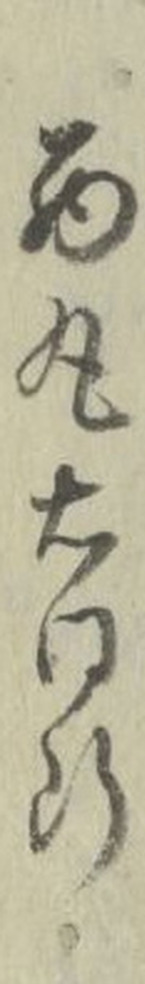西丸右同断
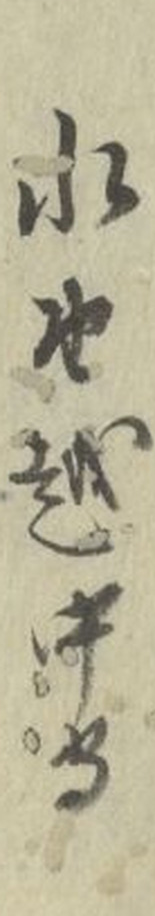同沢瀉水野越中守
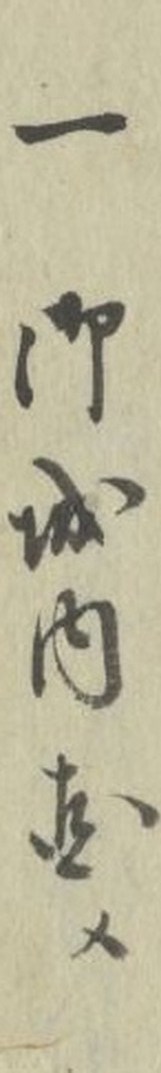一御城内固め
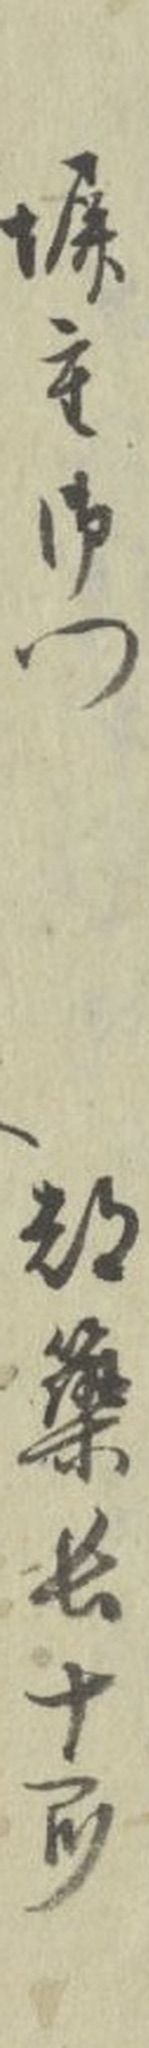塀重御門都築長十郎
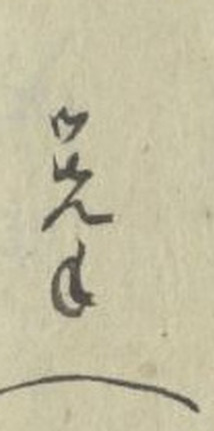御先手
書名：琉球来朝記 自一至七
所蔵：University of the Ryukyus Library
